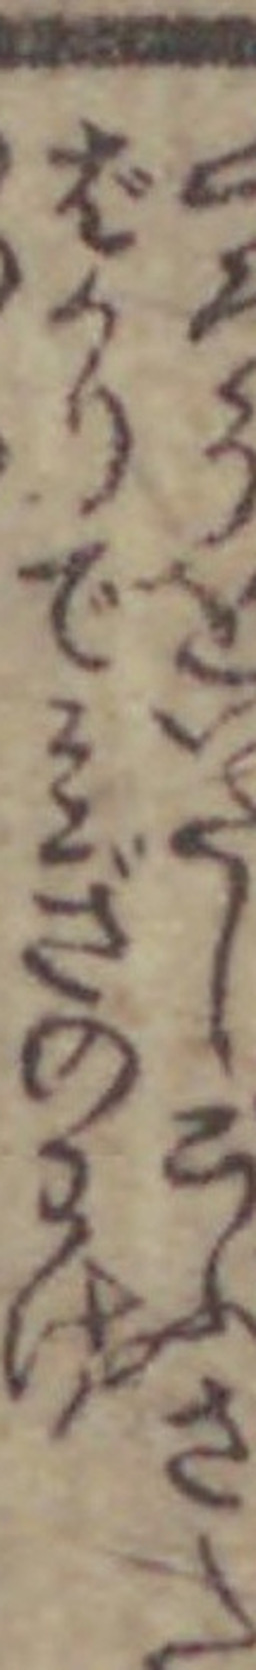ばかりでみぎのわけ
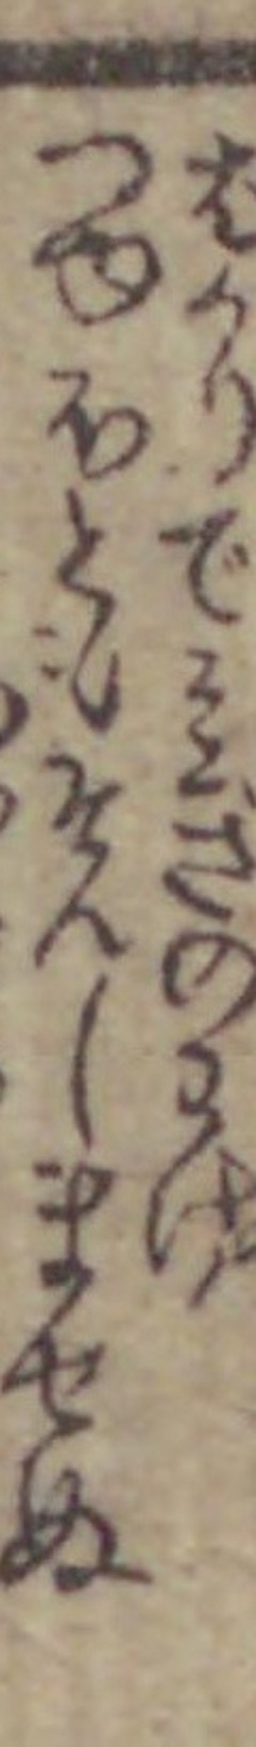つゆほともそんしませぬ
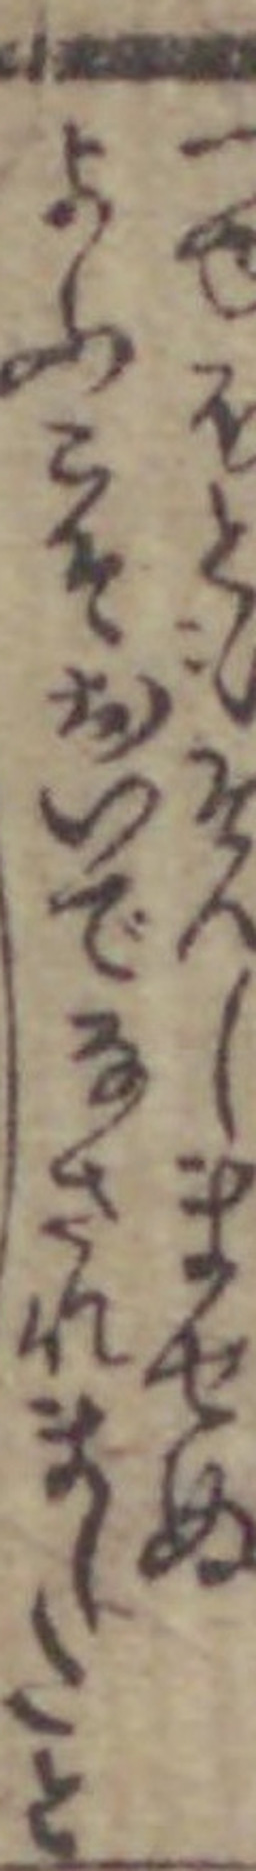よふこそおいでなされましたと
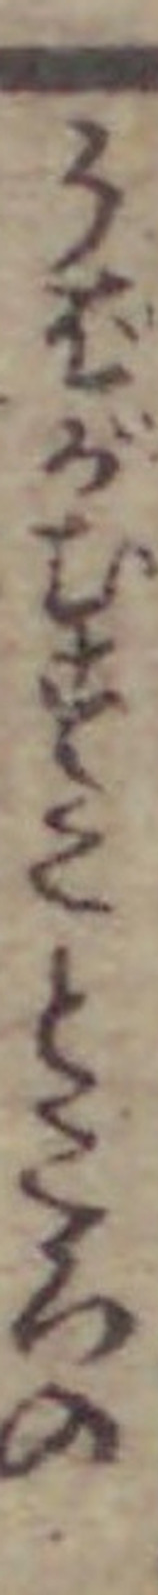うばがむすこところの
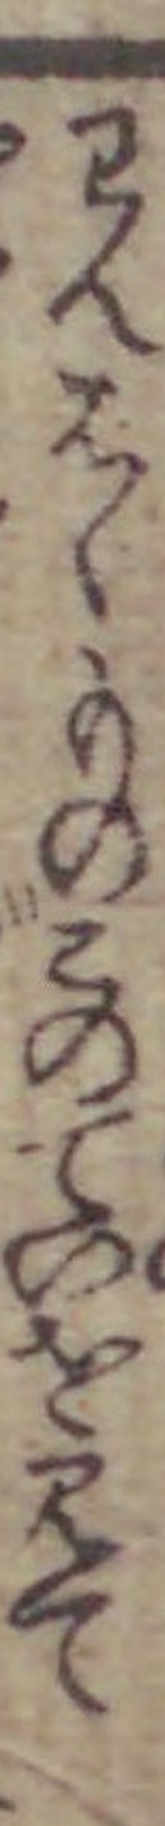わんはくものこのていを見て
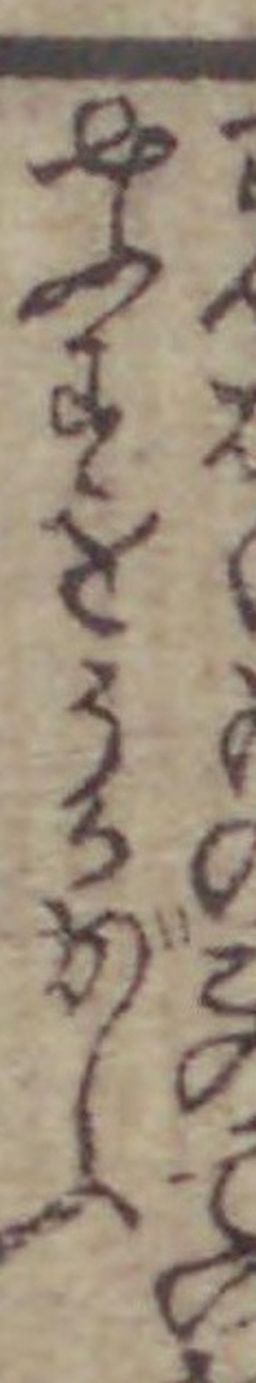やふすをうかがふ
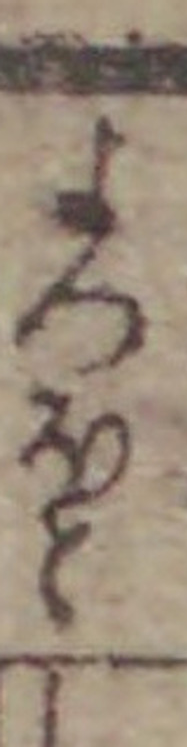よつほと
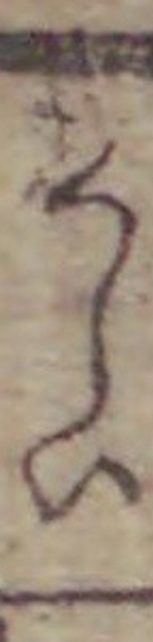くしい

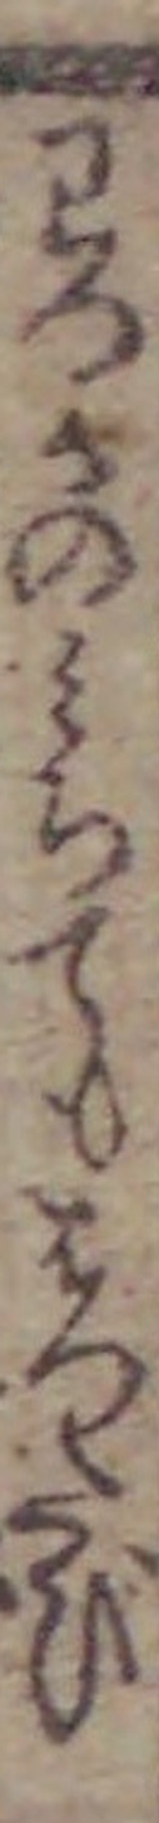わつかのみちてもはつたび
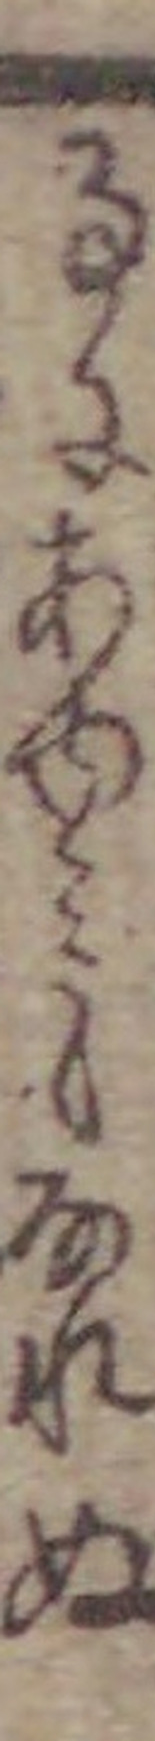事にあゆみもなれぬ
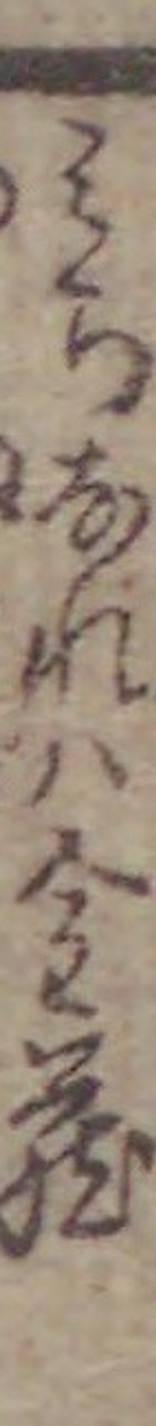みちなれは金蔵
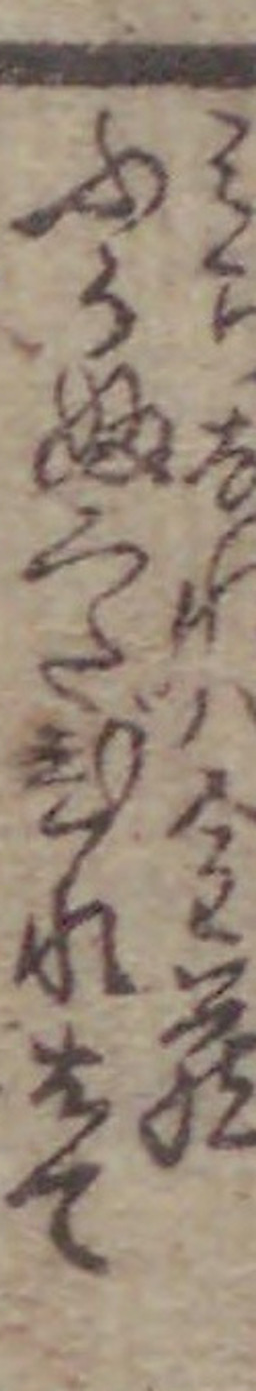ふうふくたびれはて
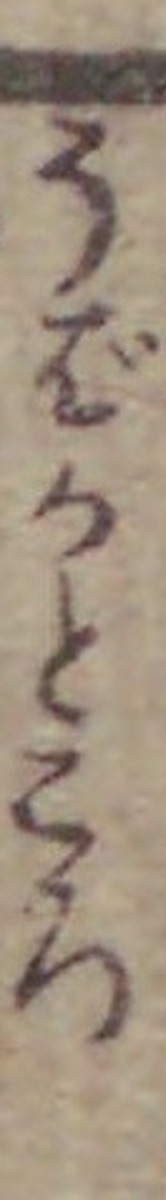うばかところ
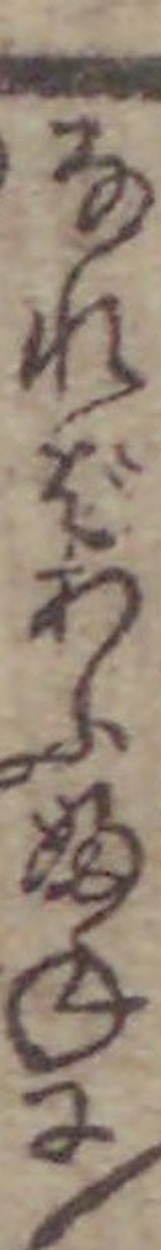なればあふふねに
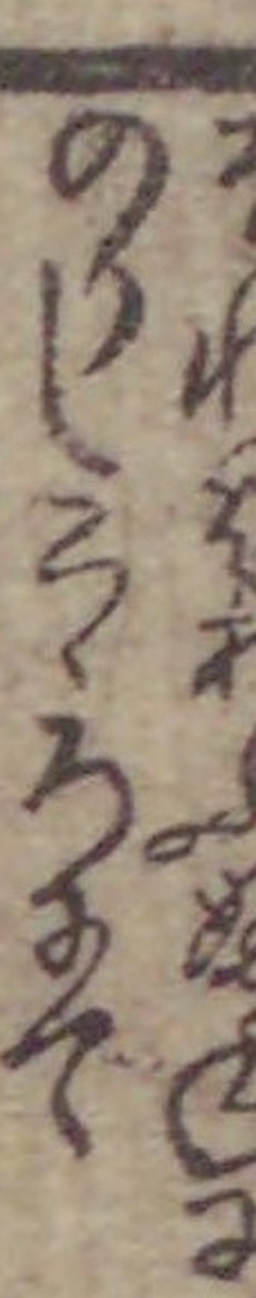のりしこゝろにて
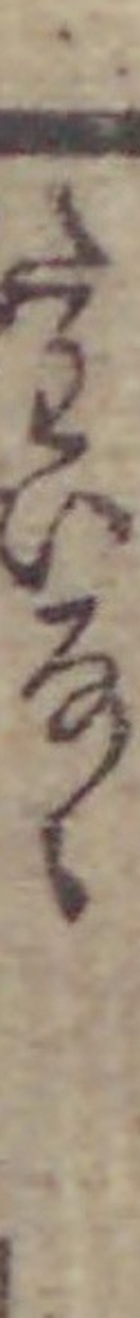たわいなく
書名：御代の御寶
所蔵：国立国会図書館 National Diet Library, JAPAN
